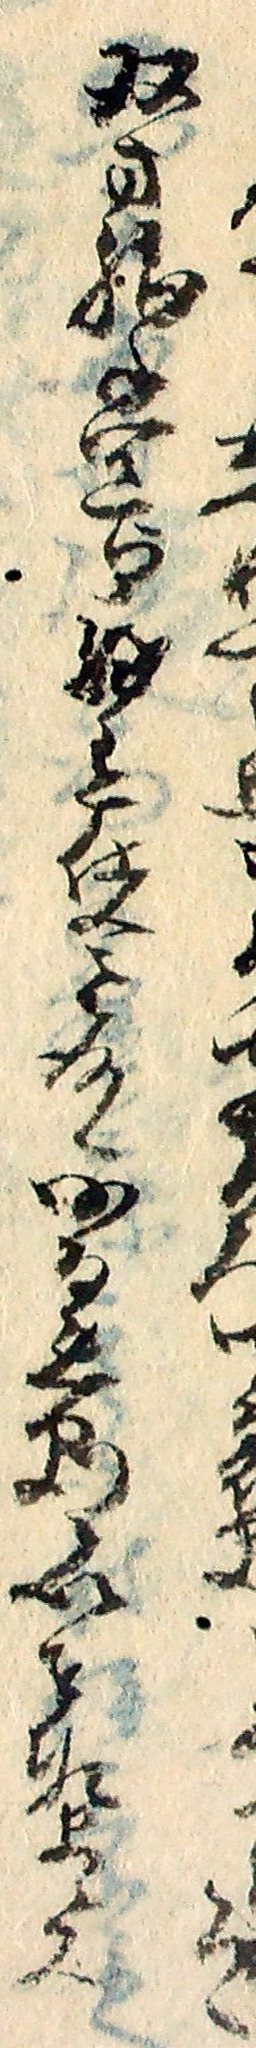双方勝手宜布難有仕合奉存候仍て連判を以奉願上候以上
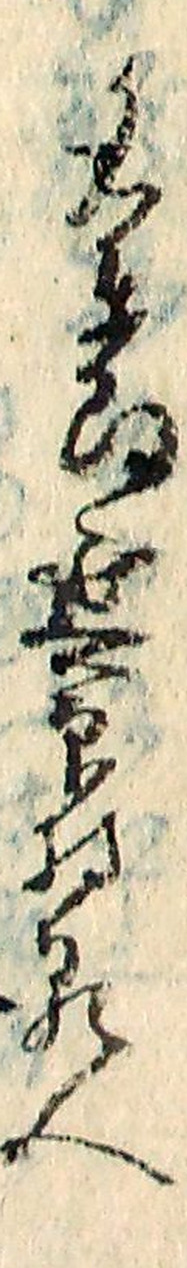名東郡延命村願人

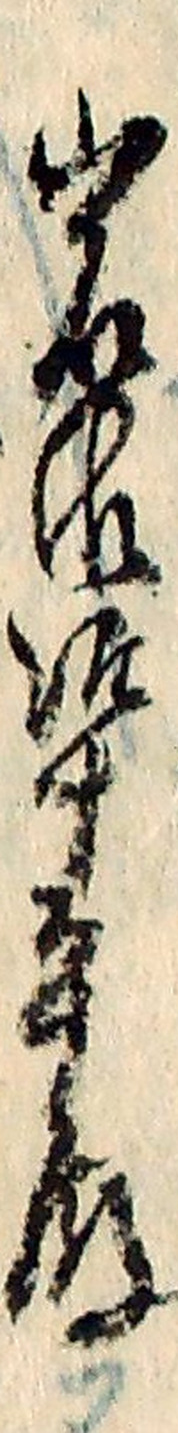岩佐準平殿
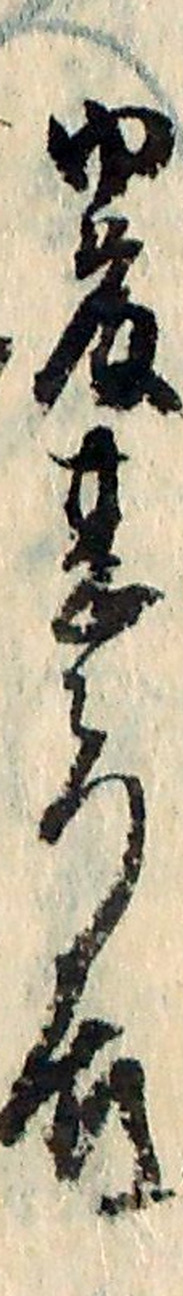内藤甚右衛門殿
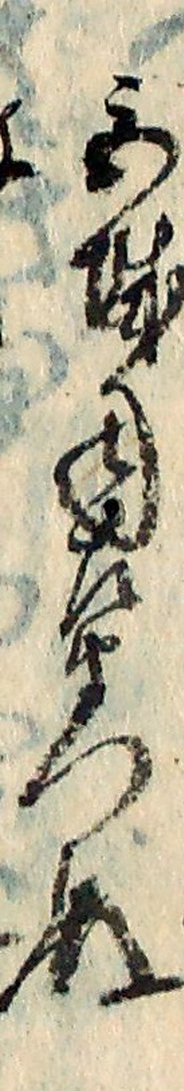宮城周左衛門殿
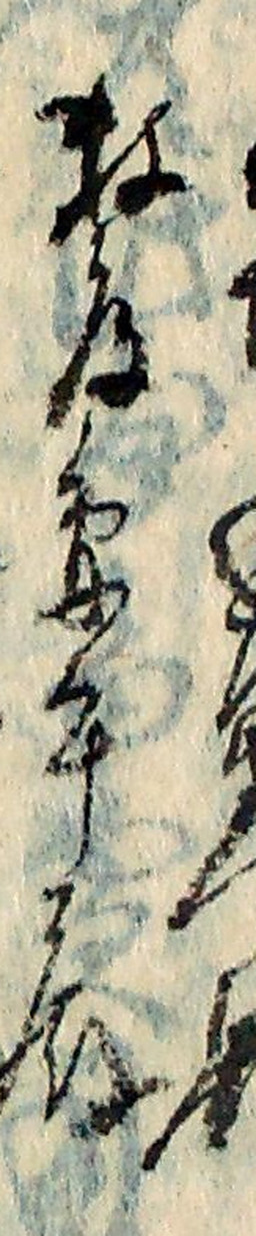数藤円平殿
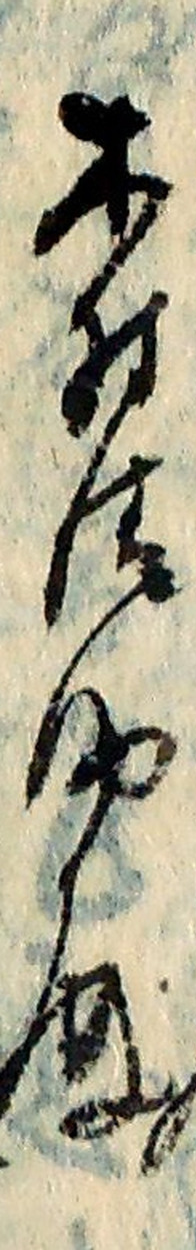木村清助殿
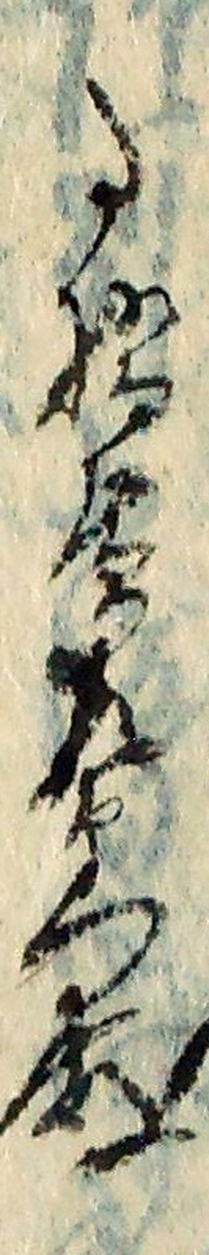高橋広左衛門殿
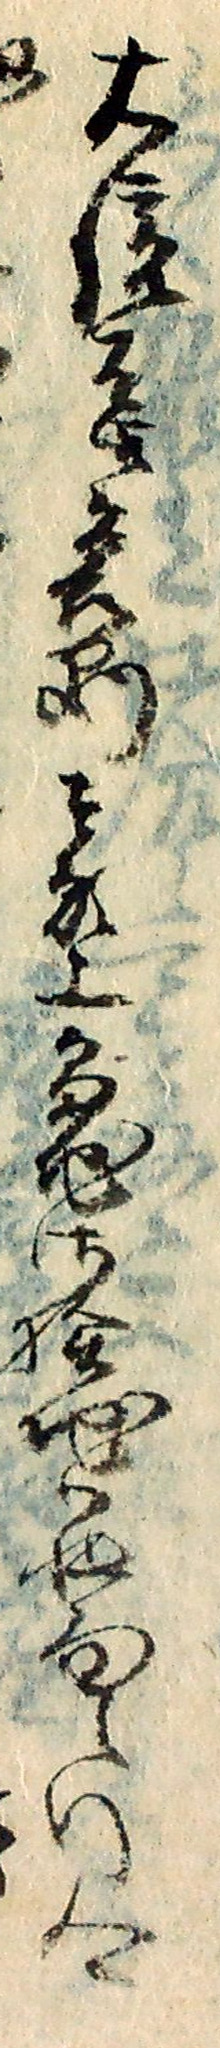右信太義裏判奉願上畠地御検地御帳面へ引合
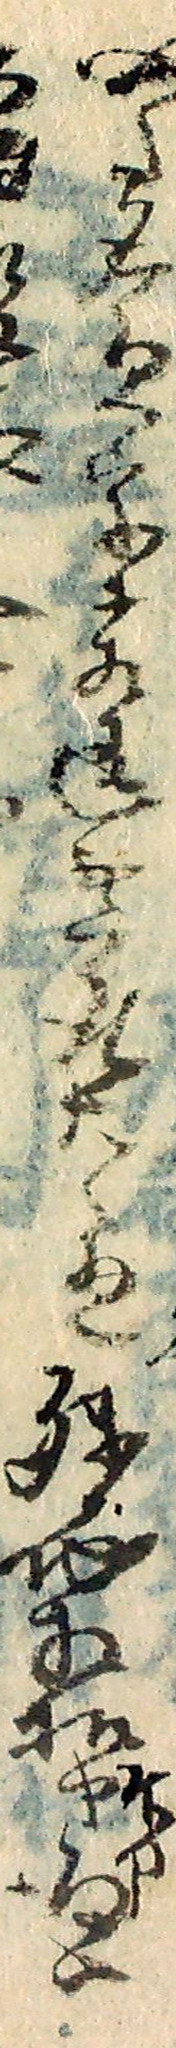双方名負字等相違無御座右之通残り地相扣居申候得は
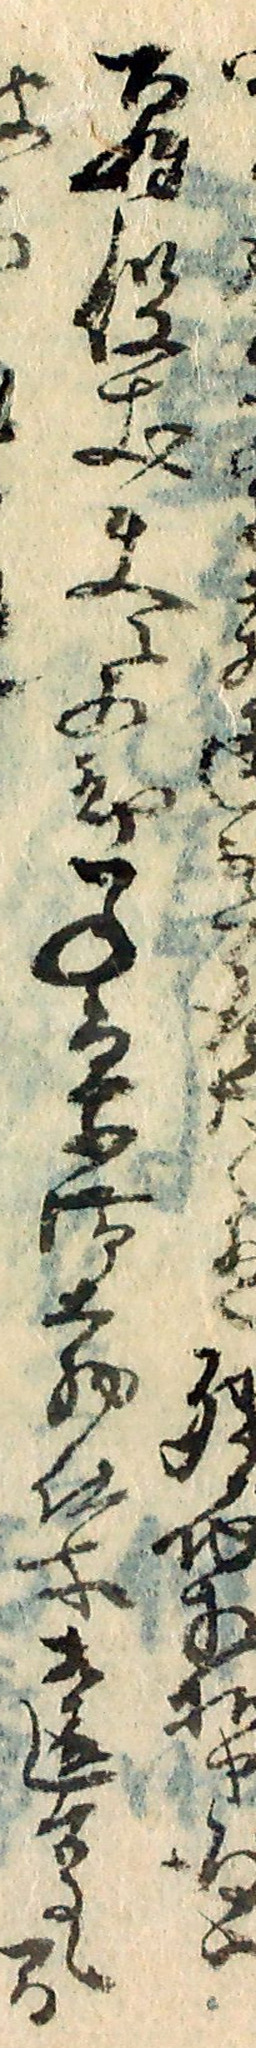百姓役丈夫に相勤御年貢不滞上納仕所相違無御事候間
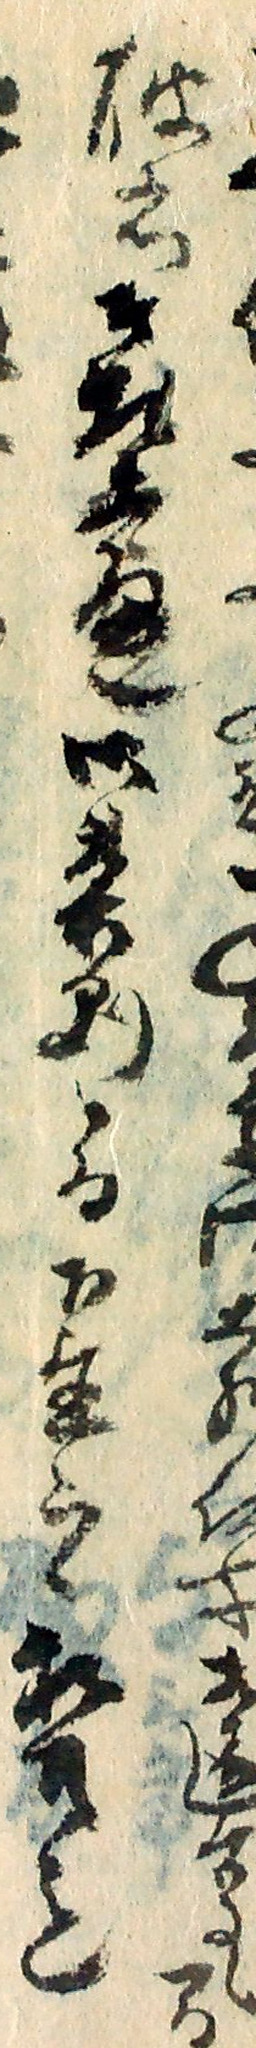彼者奉願上通御裏判被為下置候はゝ私共迄
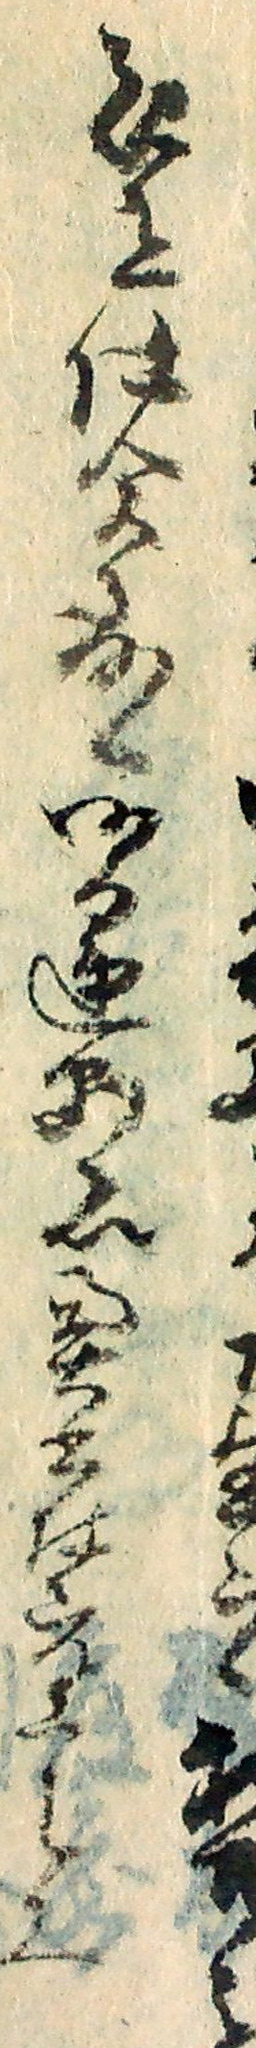難有仕合奉存候仍て連判を以奥書仕差上申候以上
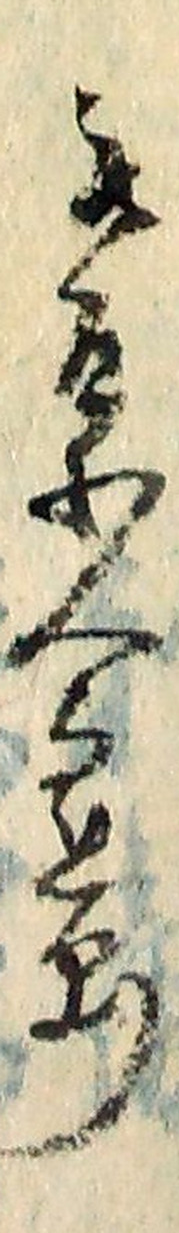庄屋五人与連判
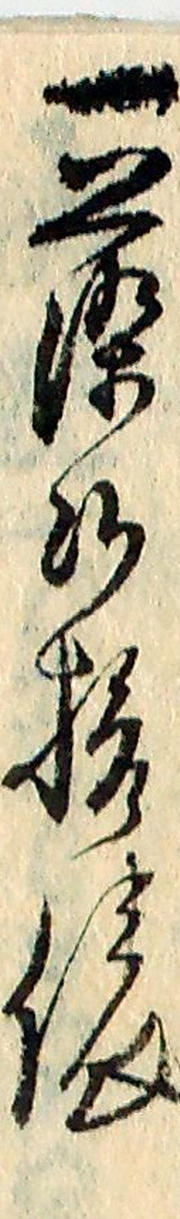一蒅弐拾俵
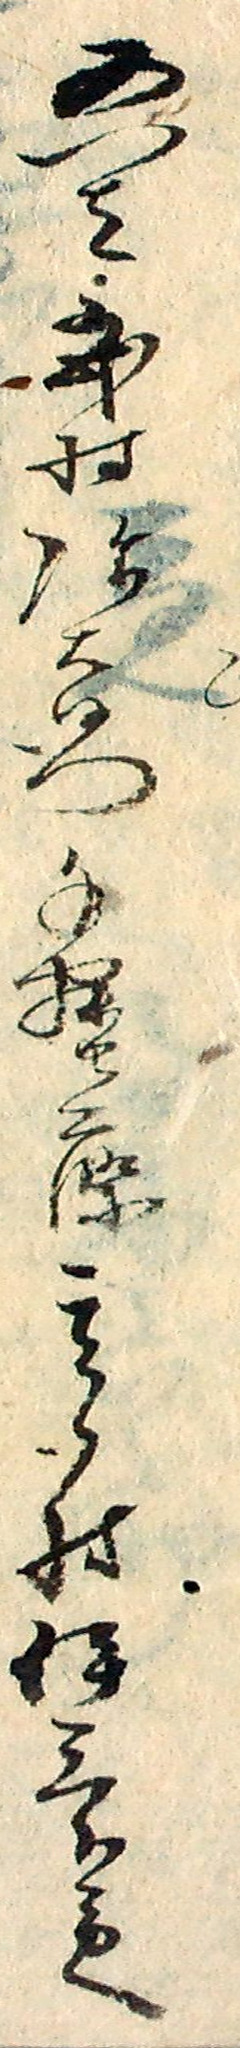右は当村弥右衛門手寐せ蒅其御村伊三郎方へ
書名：諸御願書控(後藤氏壱番）
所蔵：鳴門教育大学 Naruto University of Education
